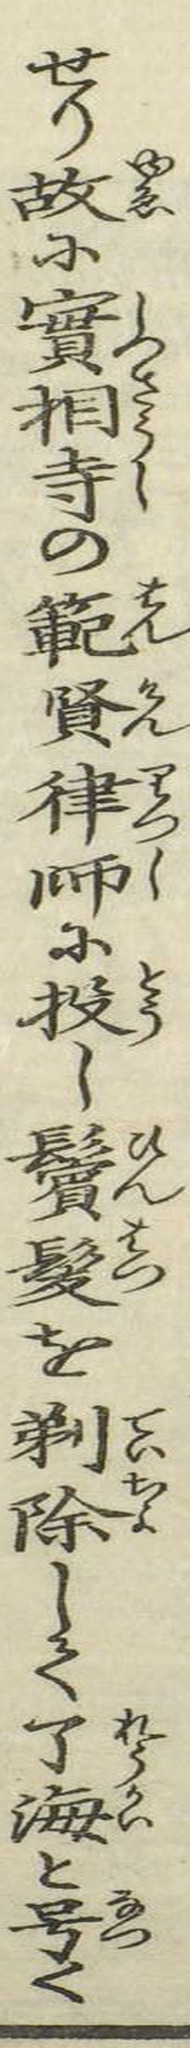せり故に實相寺の範賢律師に投し鬢髮を剃除して了海と号く
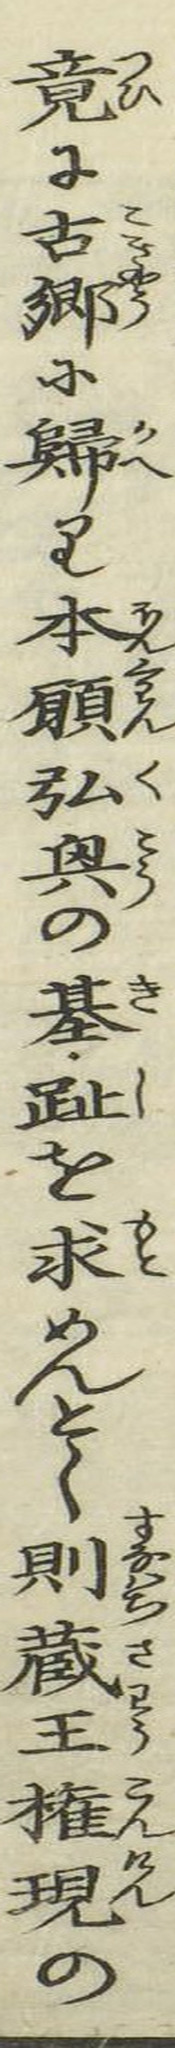竟に故郷に歸り本願弘興の基趾を求めんとし則蔵王権現の
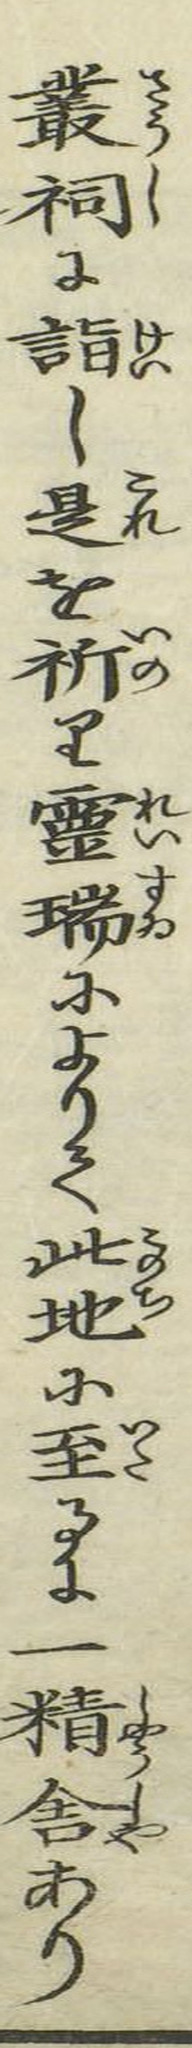叢祠に詣し是を祈り靈瑞によりて此地に至るに一精舎あり
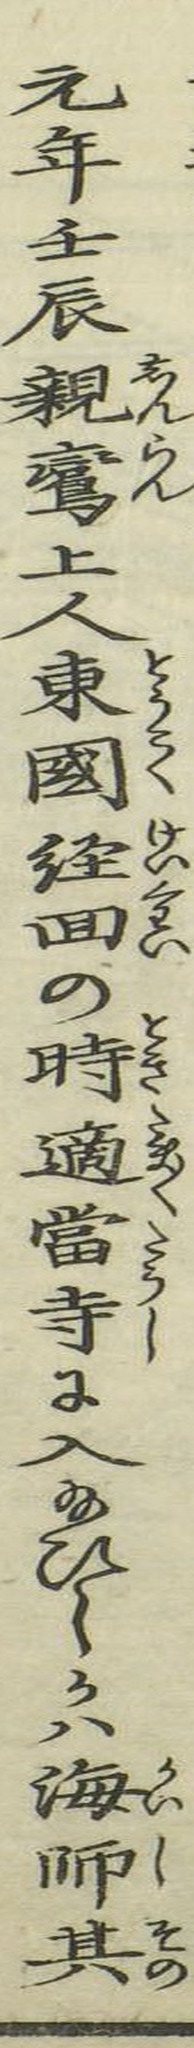元年壬辰親鸞上人東國経回の時適當寺に入給ひしかは海師其

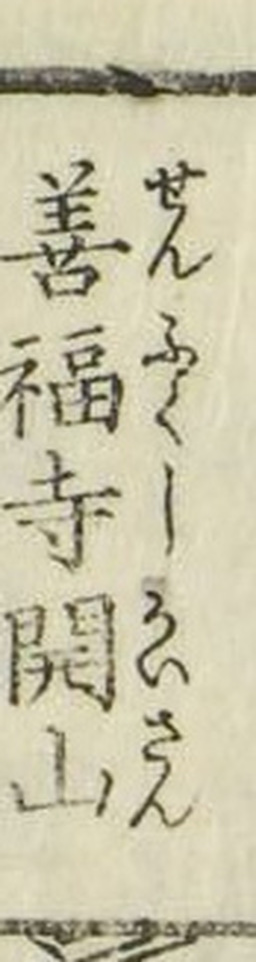善福寺開山
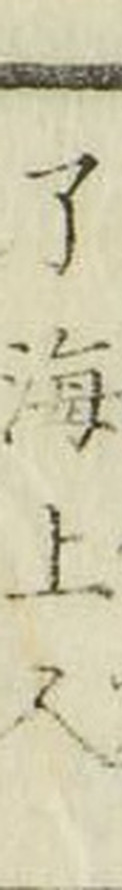了海上人

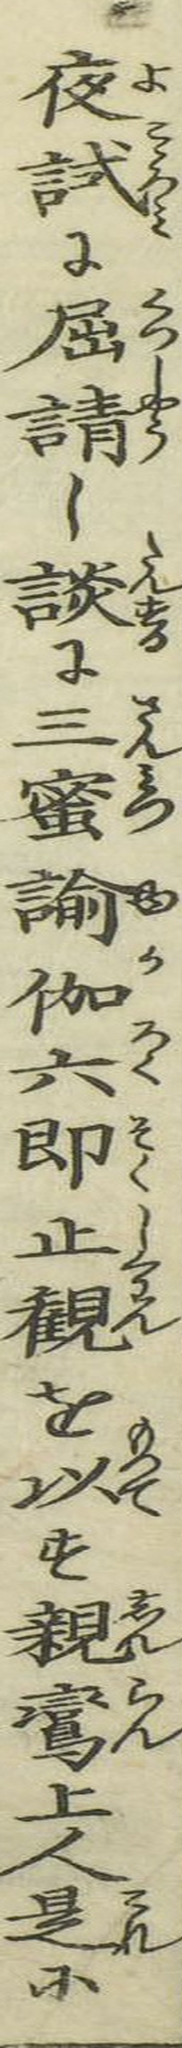夜試に屈請し談に三蜜諭伽六即止観を以す親鸞上人是に
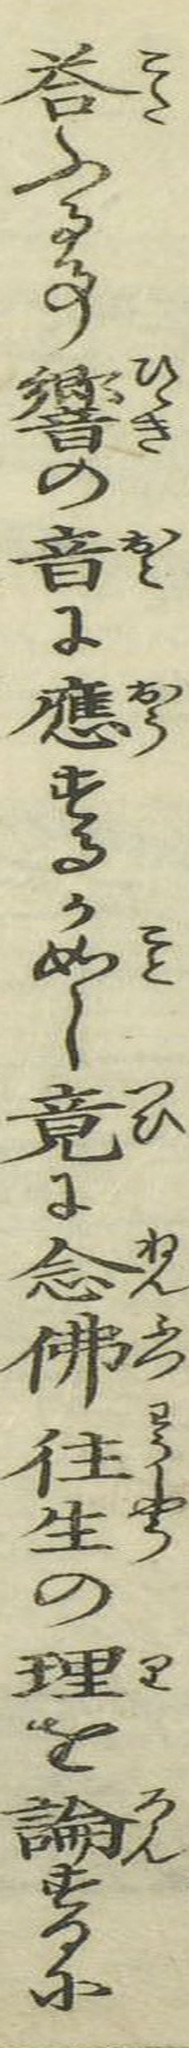答ふる事響の音に應するか如し竟に念佛往生の理を論するに
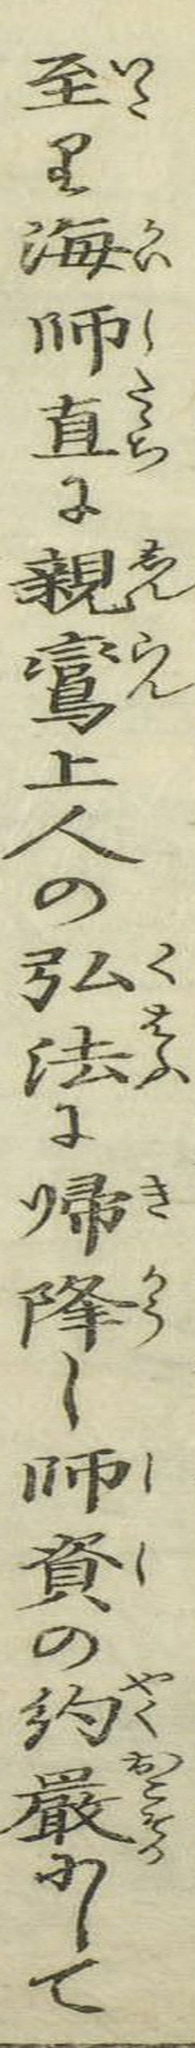至り海師直に親鸞上人の弘法に帰降し師資の約嚴にして
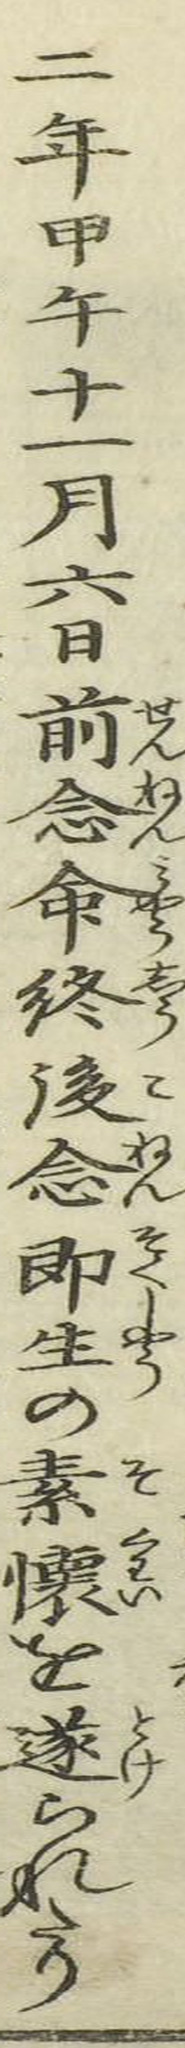二年甲午十一月六日前念命終後念即生の素懐を遂られたり
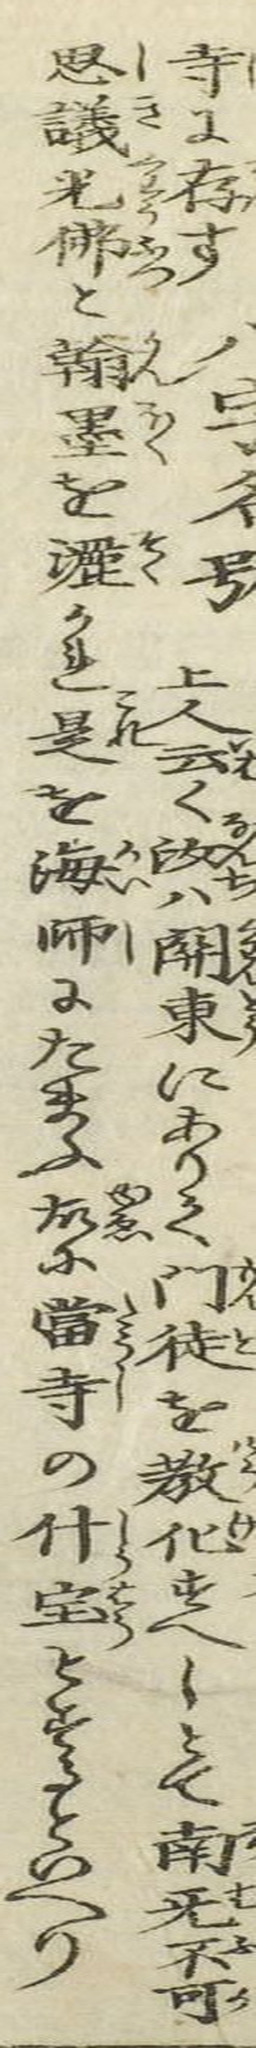思議光佛と翰墨を灑かれ是を海師にたまふ故に當寺の什宝とするといへり
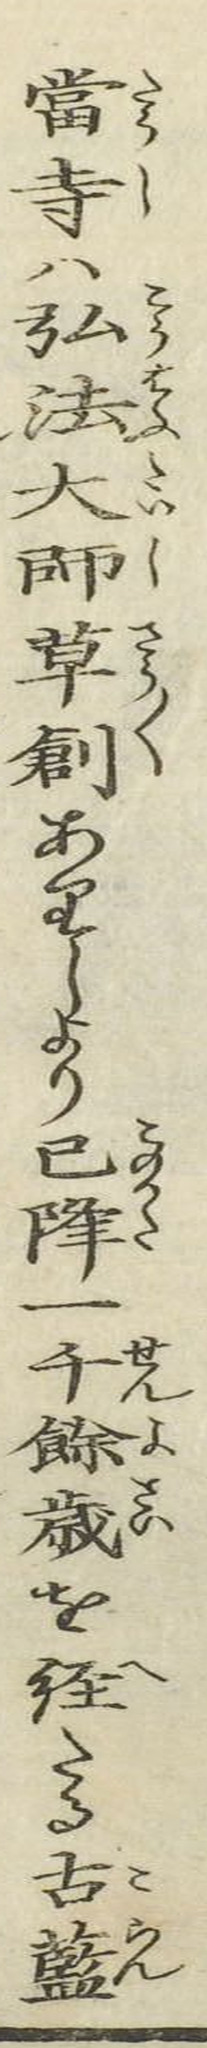當寺は弘法大師草創ありしより已降一千餘歳を経たる古藍
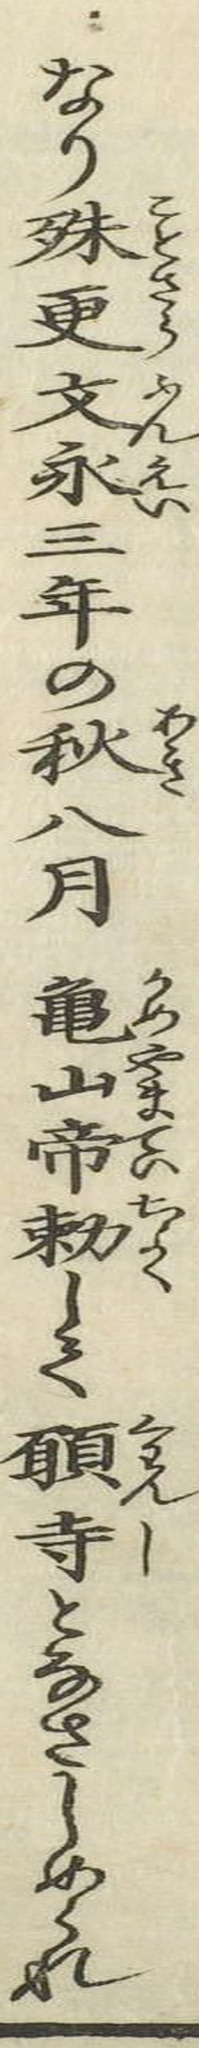なり殊更文永三年の秋八月亀山帝勅して願寺となさしめられ
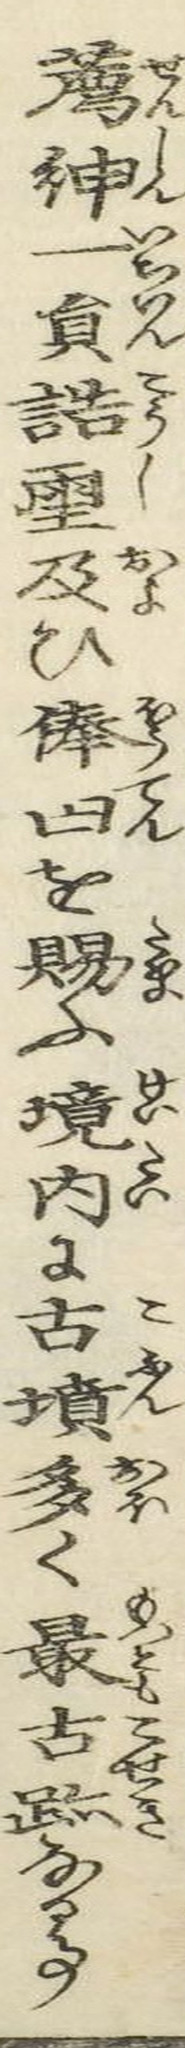薦紳一員詰璽及ひ俸田を賜ふ境内に古墳多く最古跡なる事
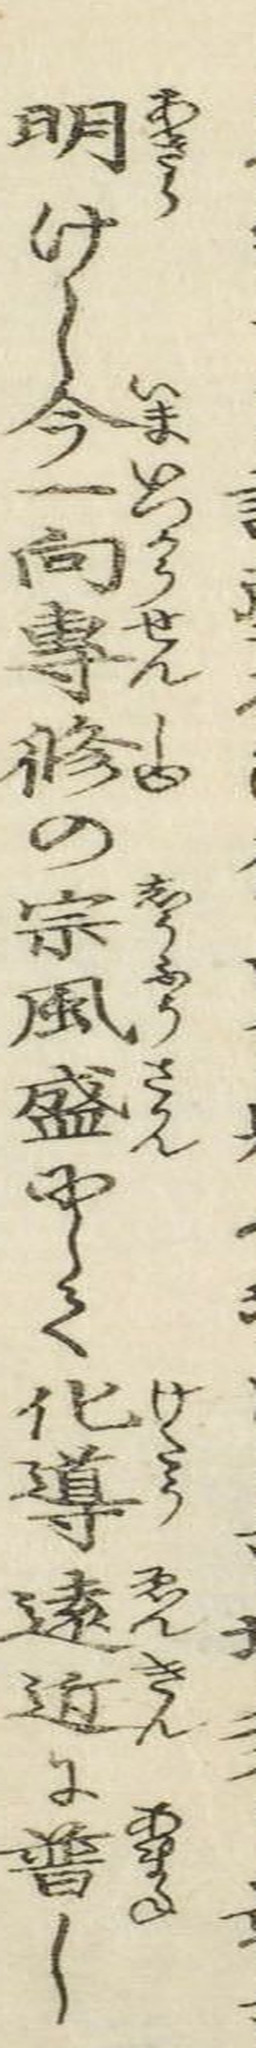明けし今一向専修の宗風盛にして化導遠近に普し
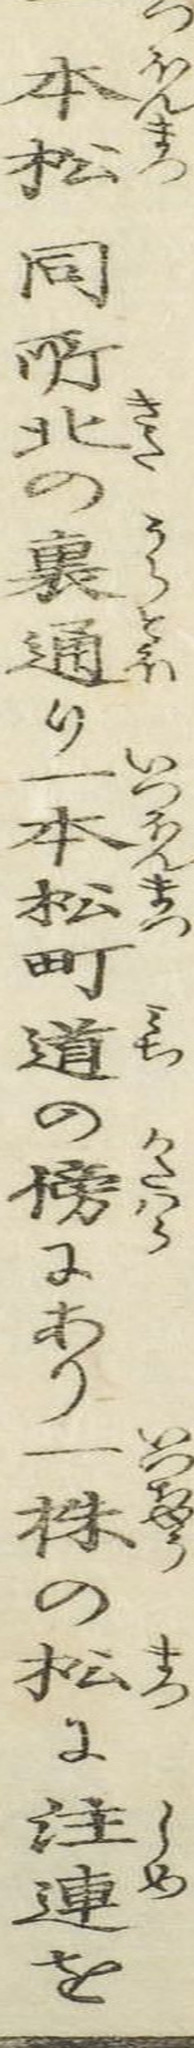一本松同所北の裏通り一本松町道の傍にあり一株の松に注連を
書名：江戸名所図会 20巻 巻之7
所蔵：東京学芸大学教育コンテンツアーカイブ
